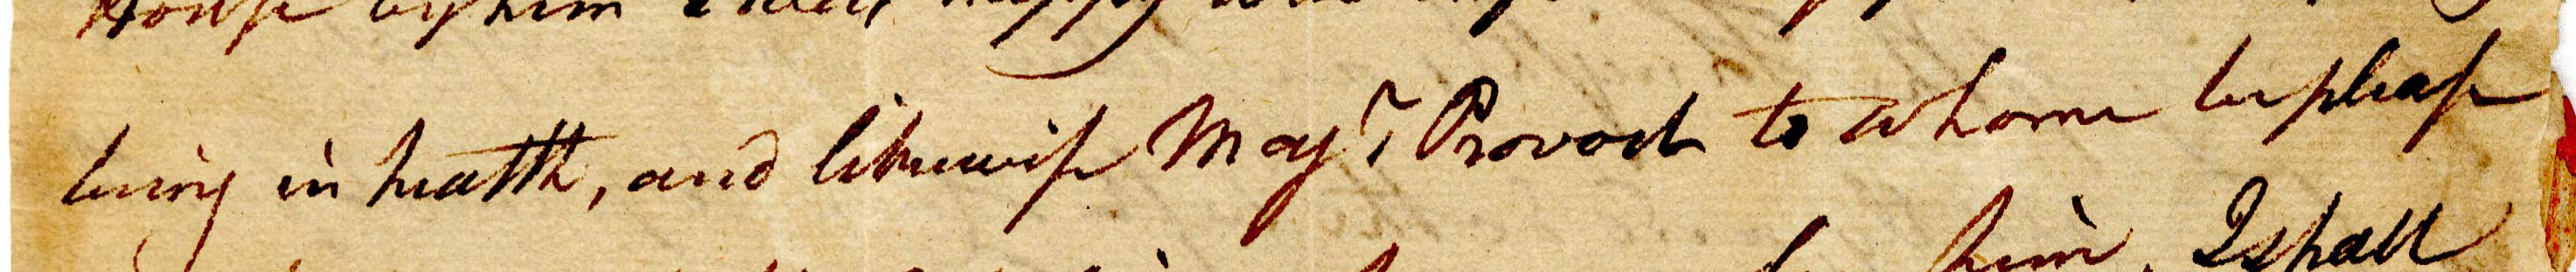being in health, and likewise Maj^r. Provost to whome be please
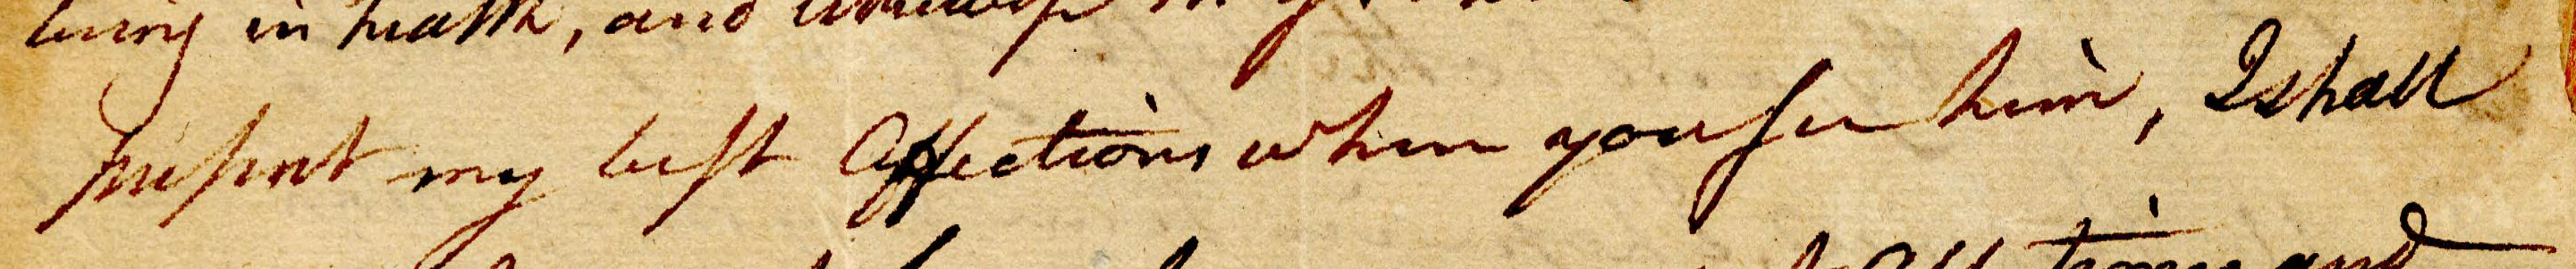present my best affections when you see him, I shall
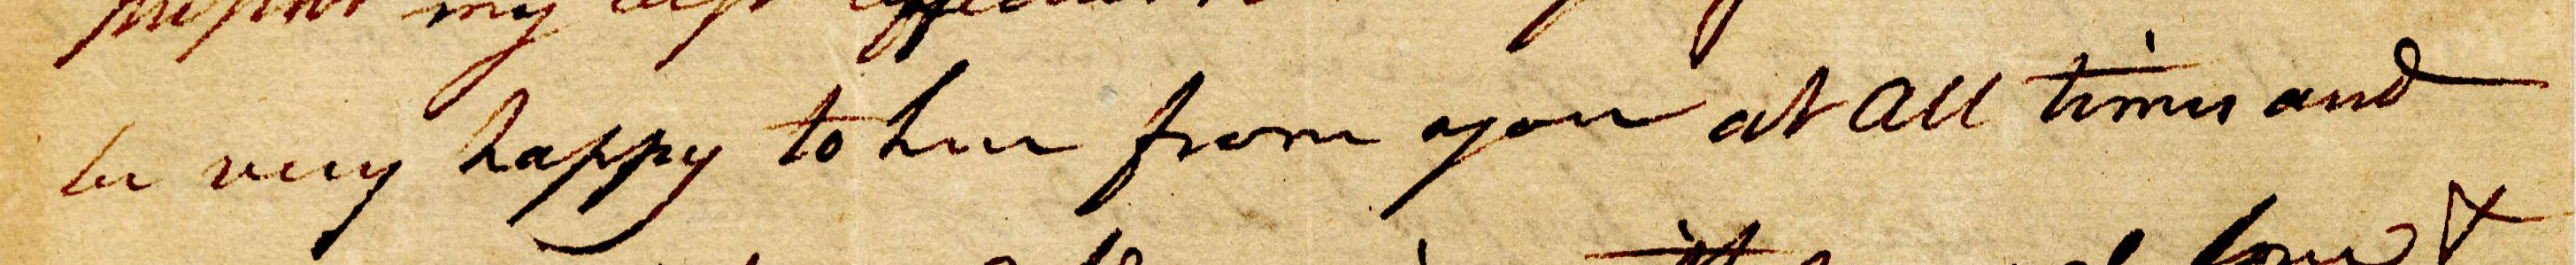be very happy to here from you at All times and
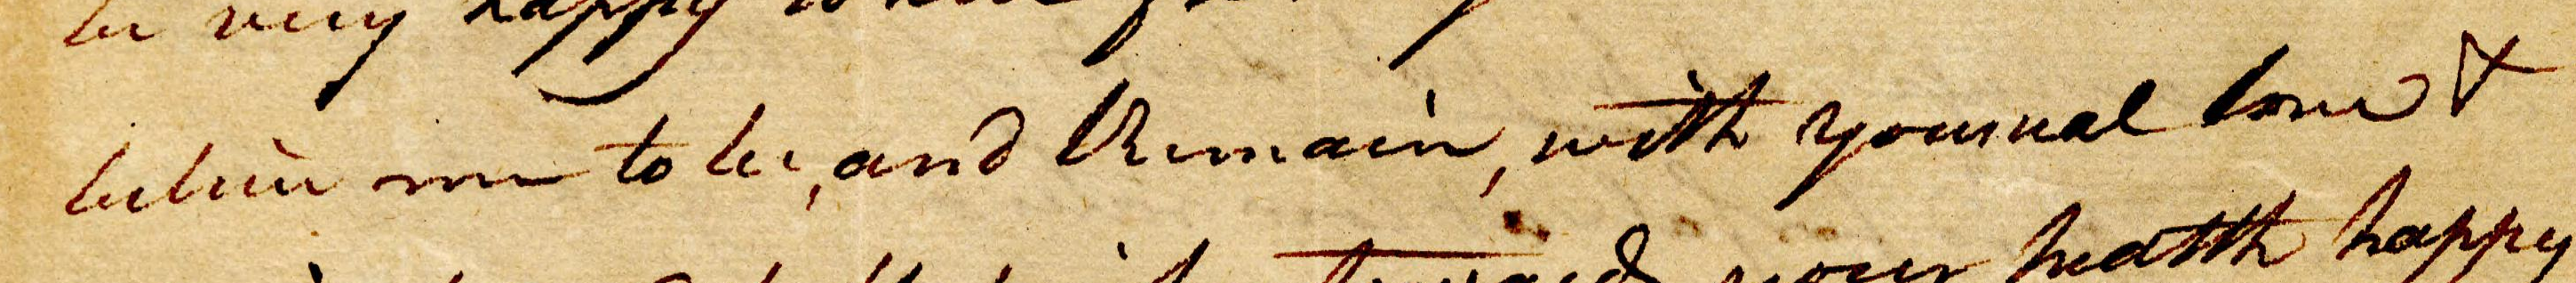belive me to be, and Remain, with you usual love &
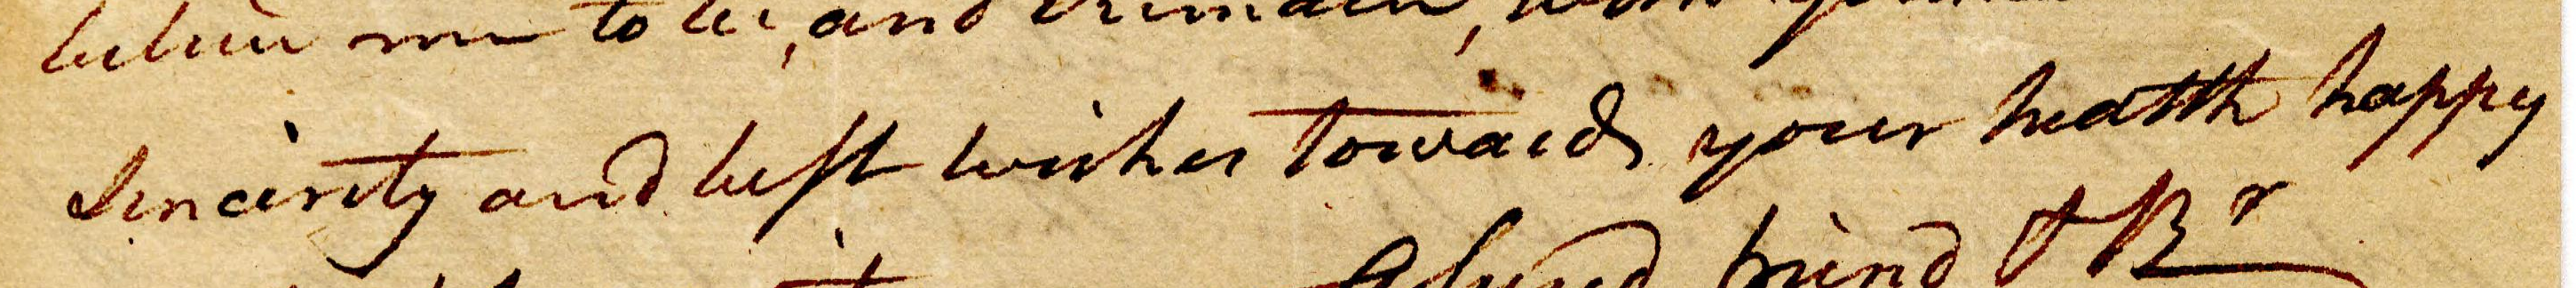sincerity and best wishes toward your health happy-
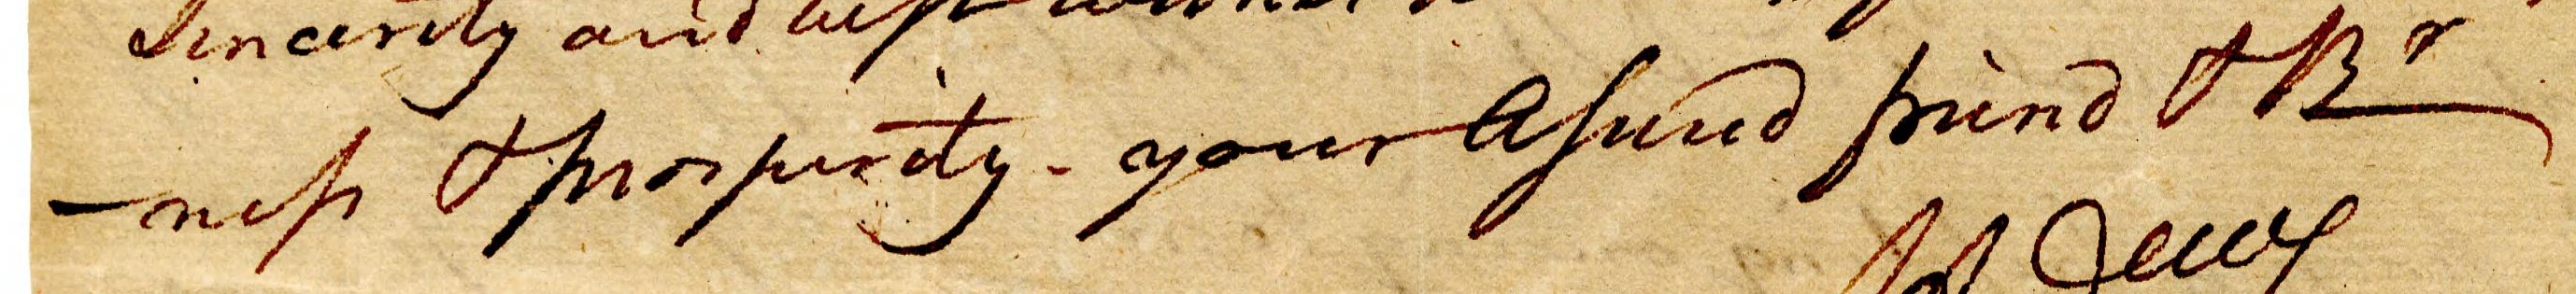-ness & prosperity. your Asured freind & B^r.
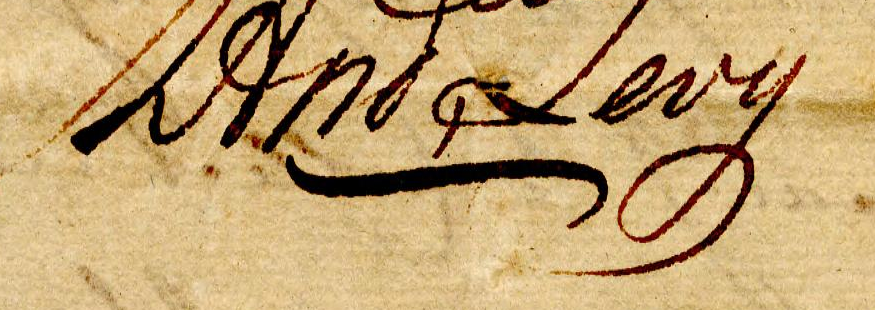And^rew Levy
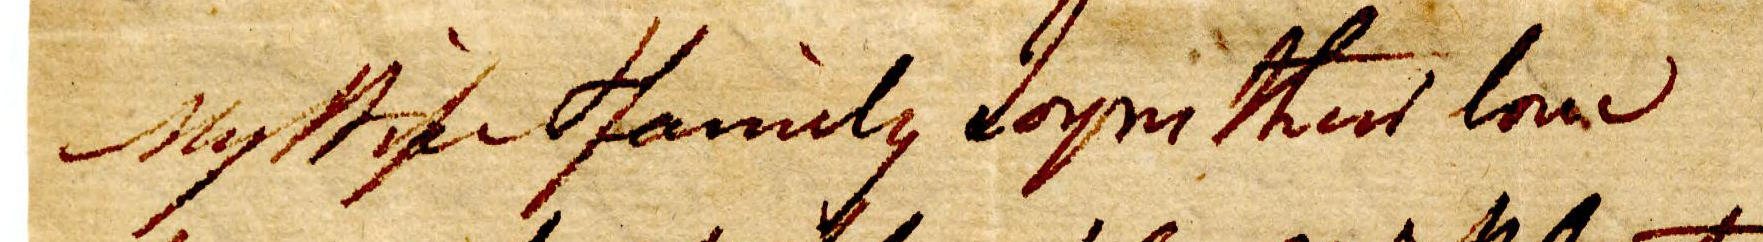My wife & family Joyns their love
